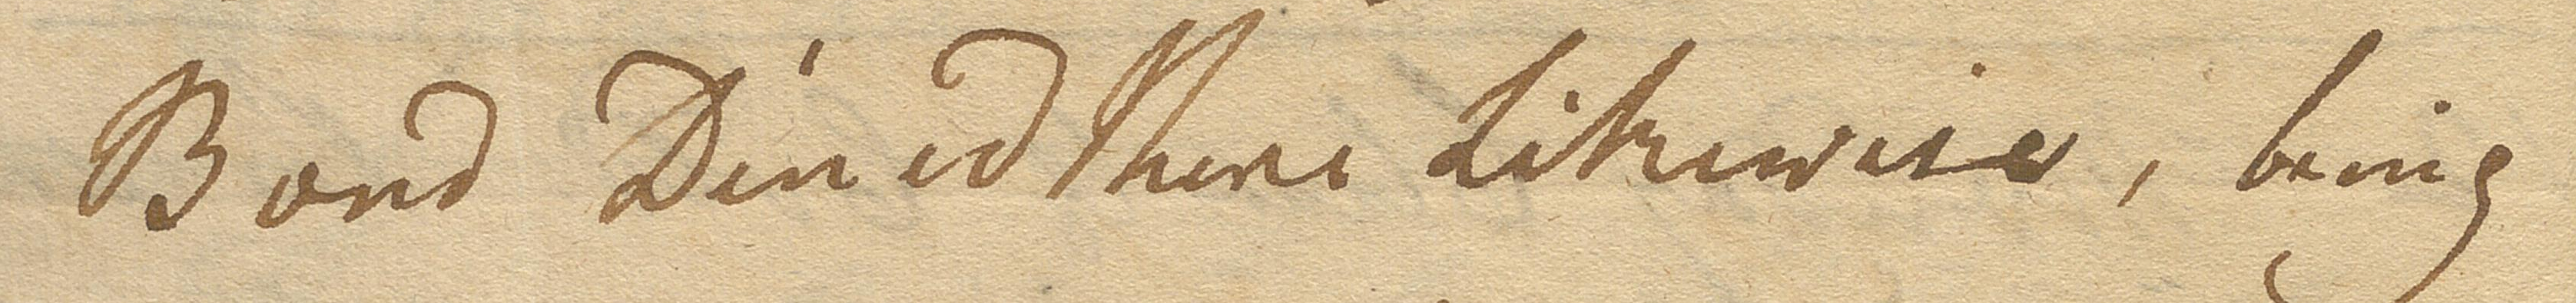Bond Dined there Likewise, being
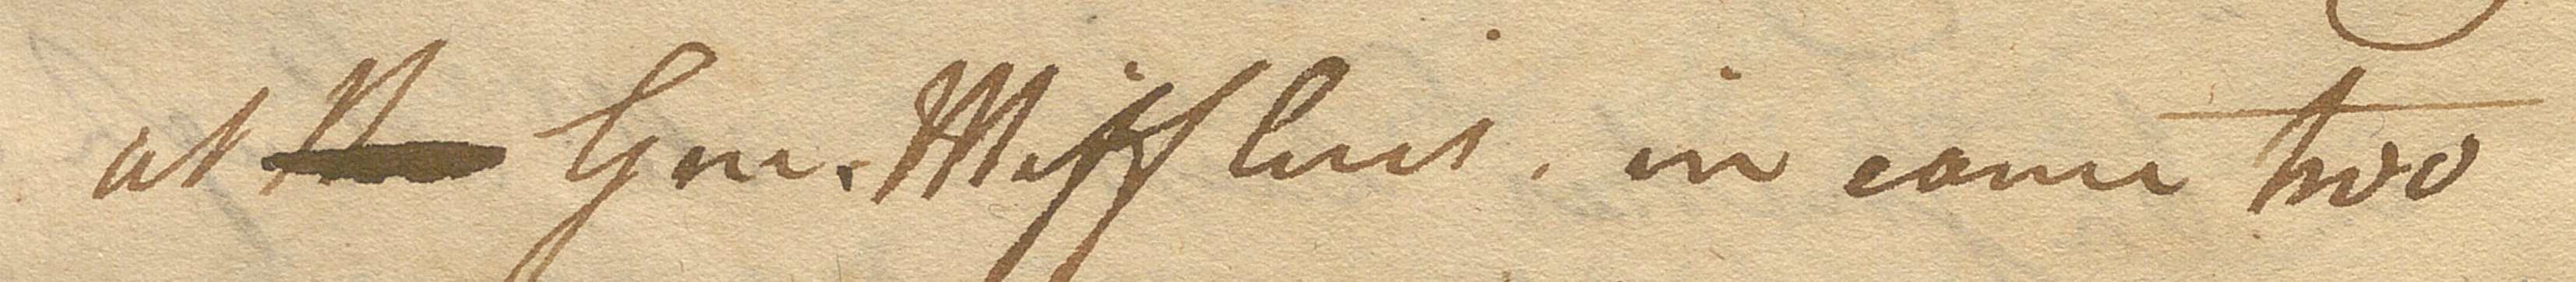at [the] Gen. Mifflins, in came two
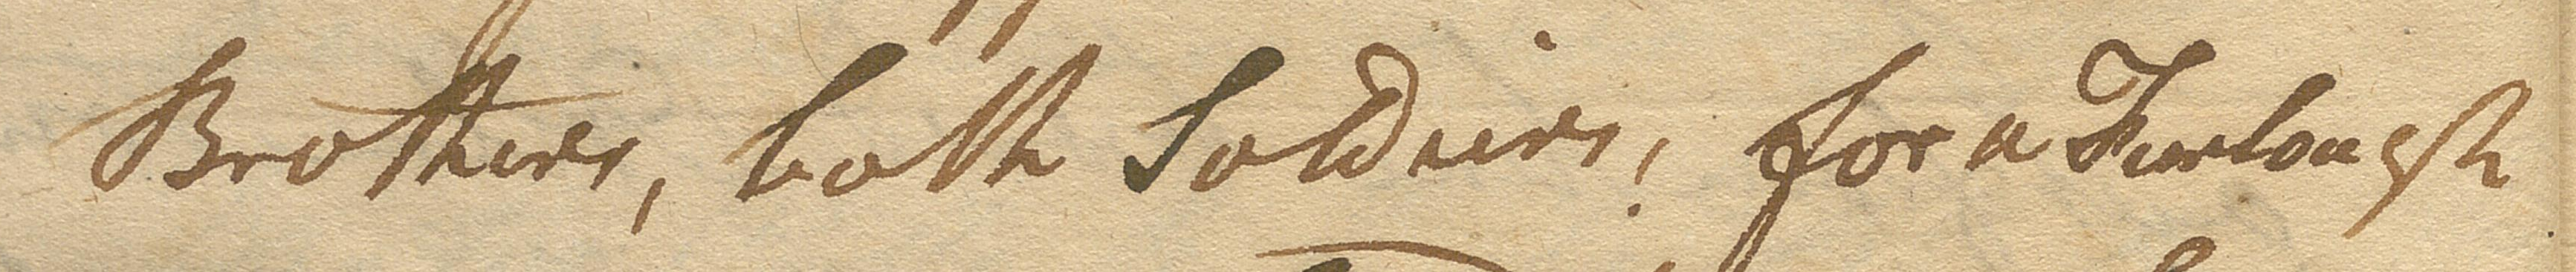Brothers, both Soldiers, for a Furlough
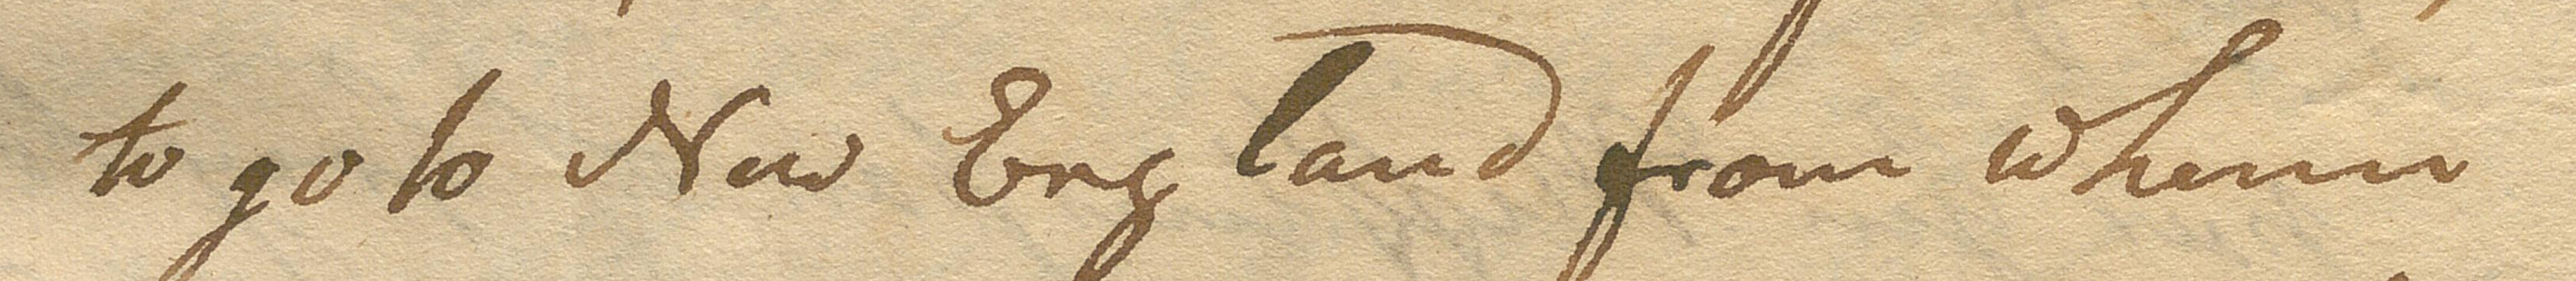to go to New England from whence
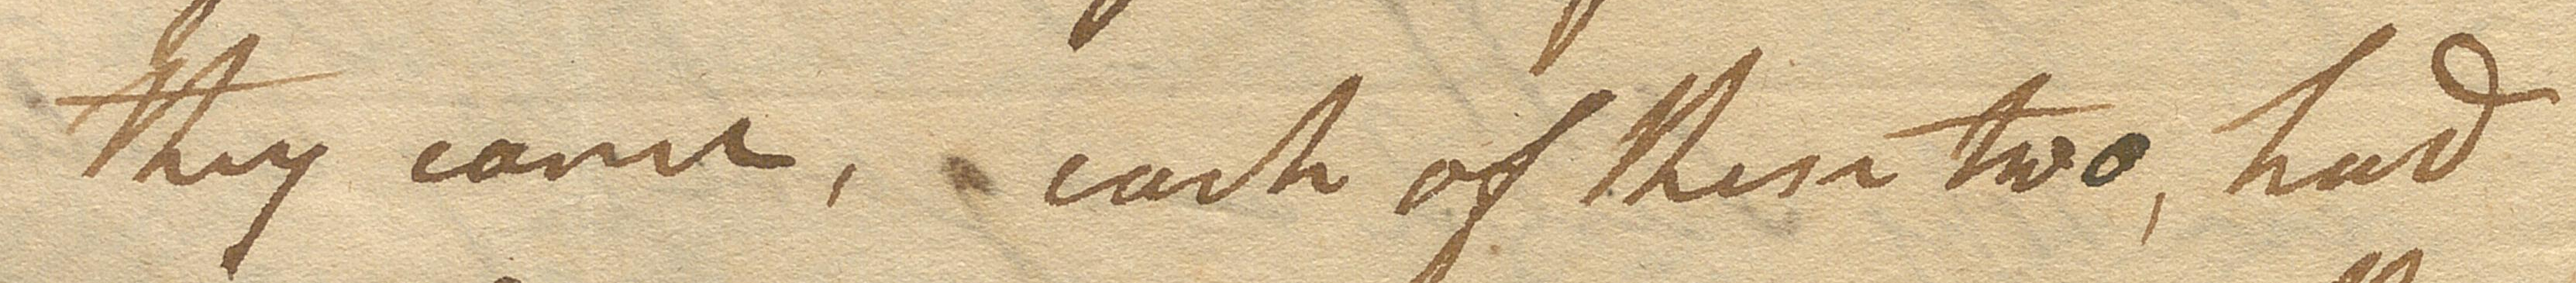they came, each of these two, had
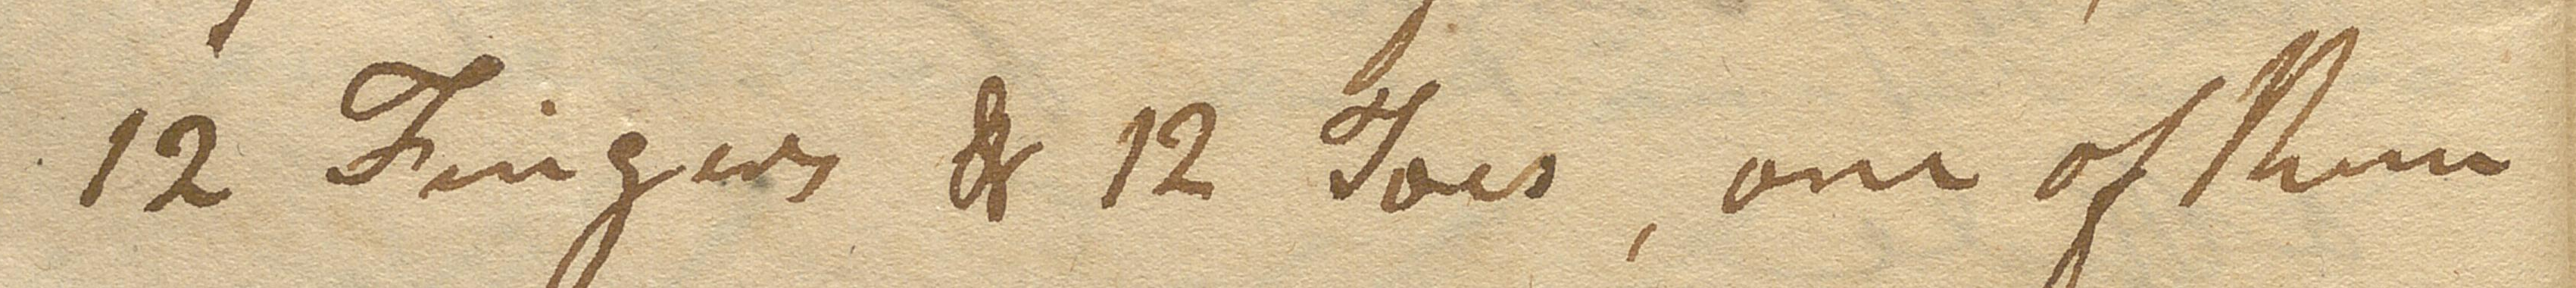12 Fingers & 12 Toes, one of them
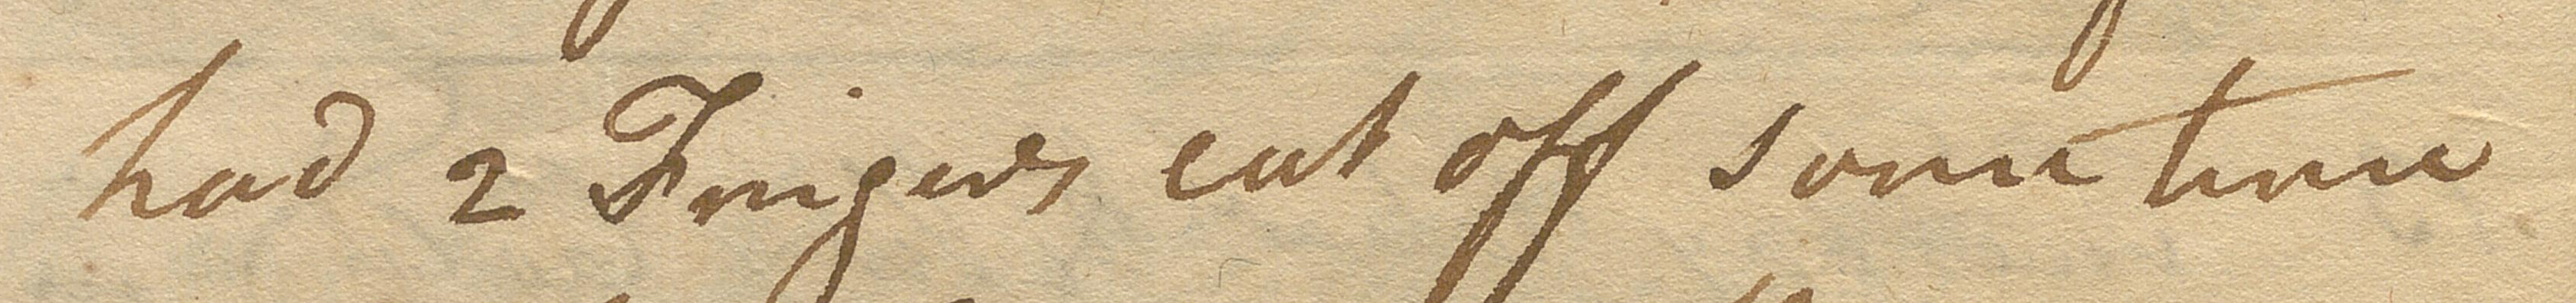had 2 Fingers cut off some time
